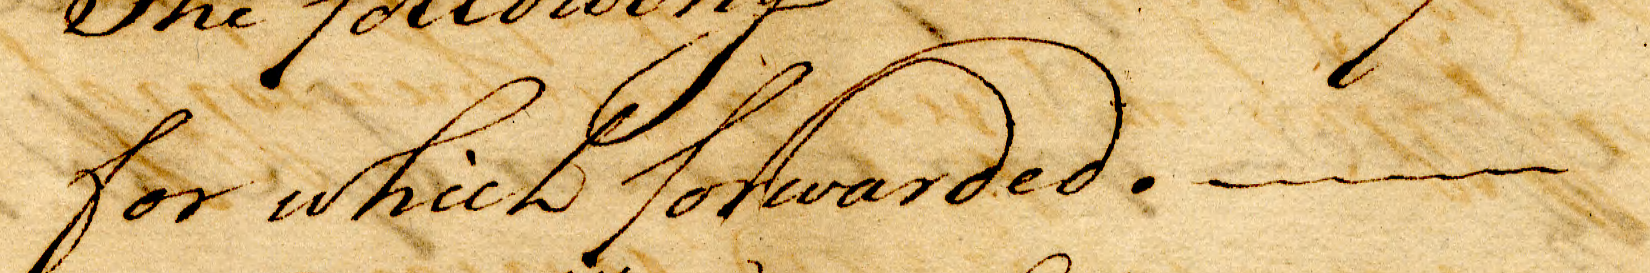for whict fparded
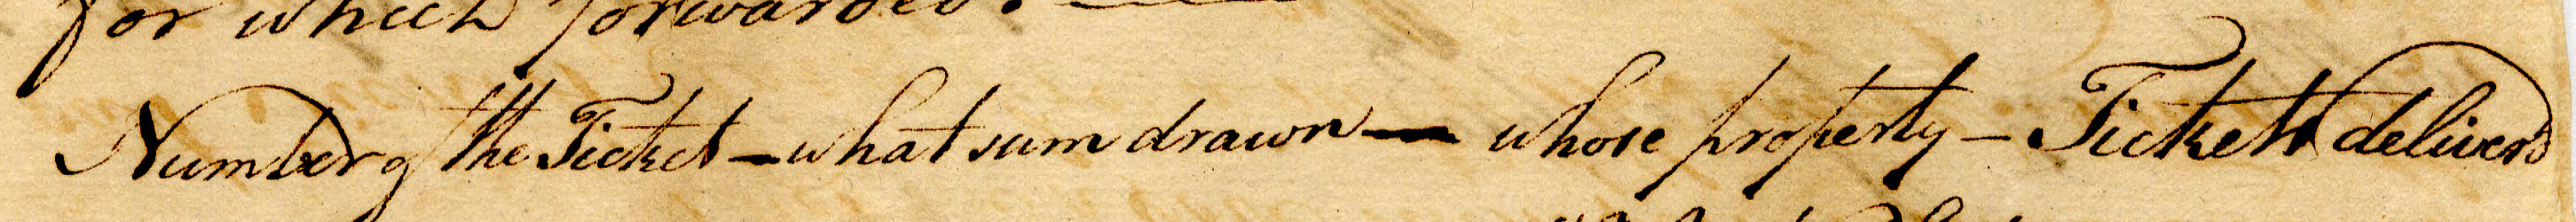Metr, bactt ietoudvere a chn poght Tcketater
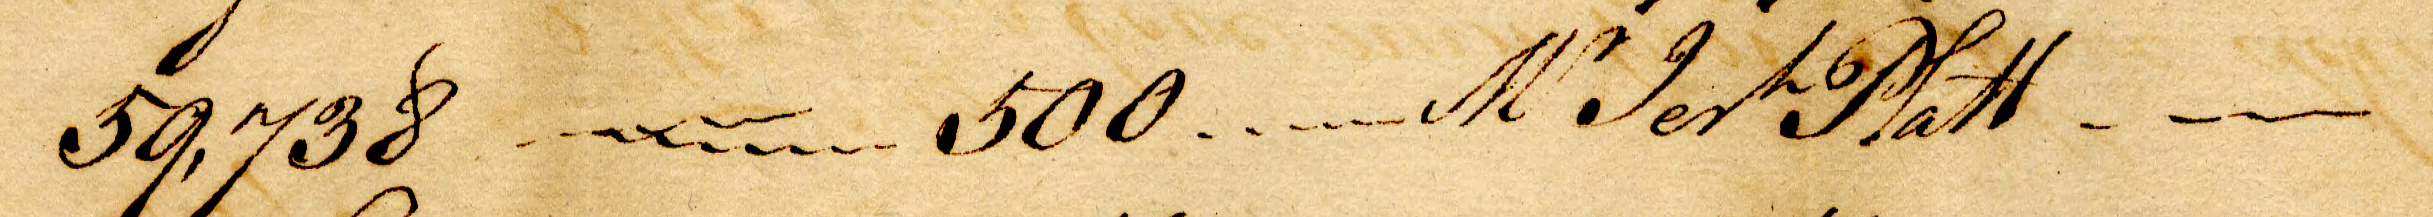57733- 500 M Se Tet
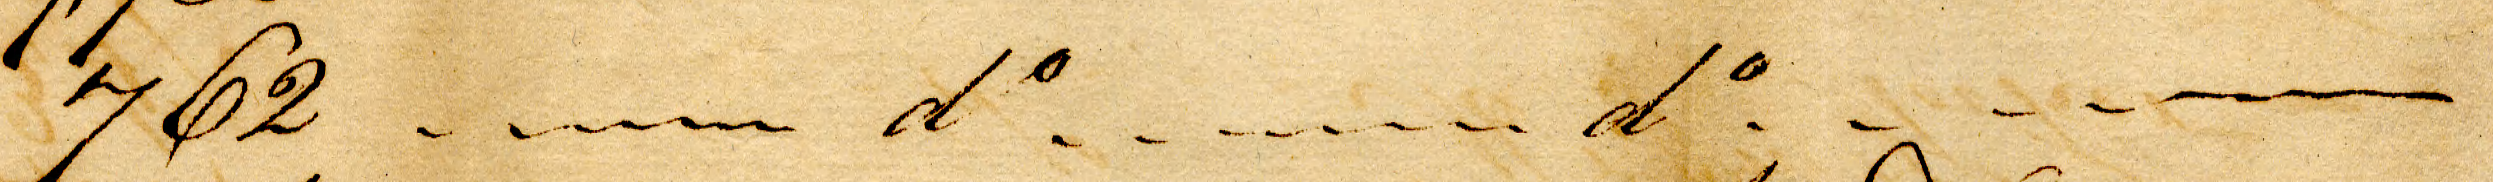13-----d---- d-
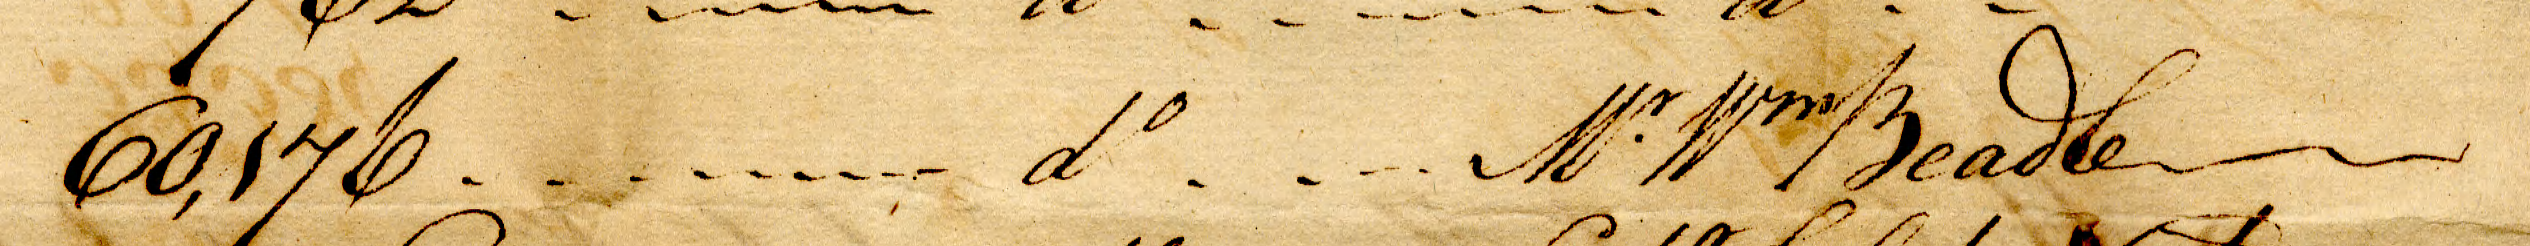b3776--- d Meatl
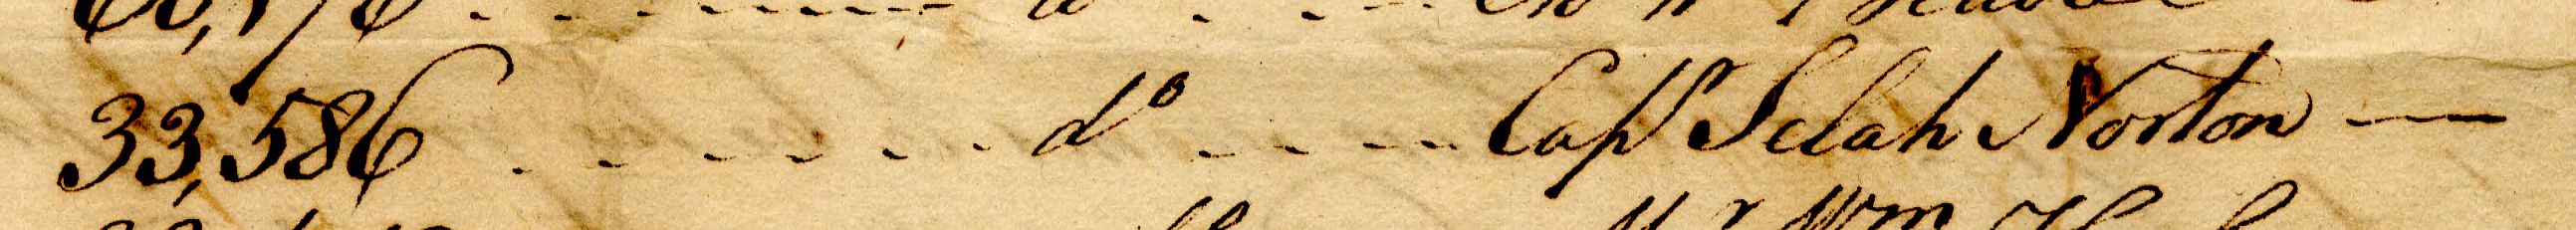33336--e-d---Cas Sitah seiteve
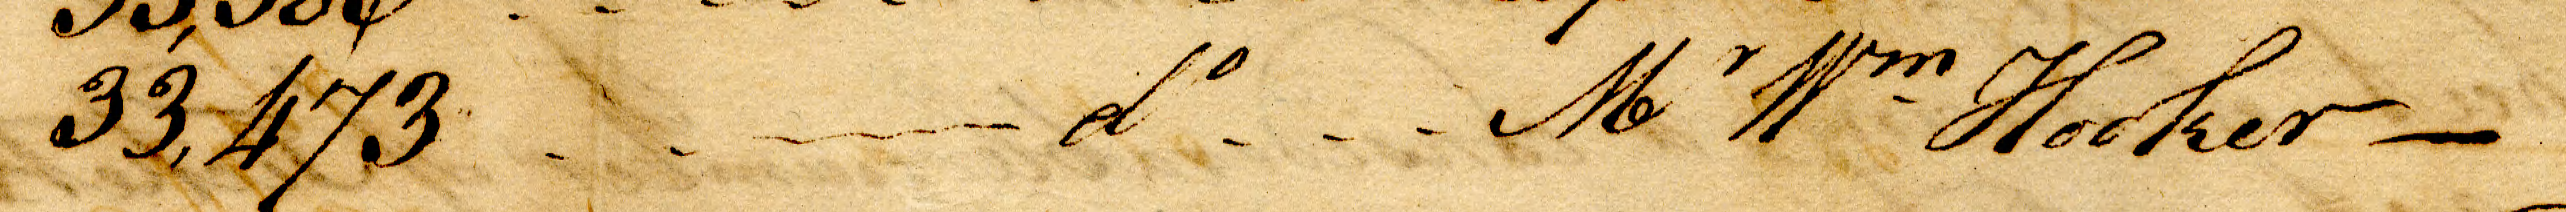33-d- M0 1 teckes
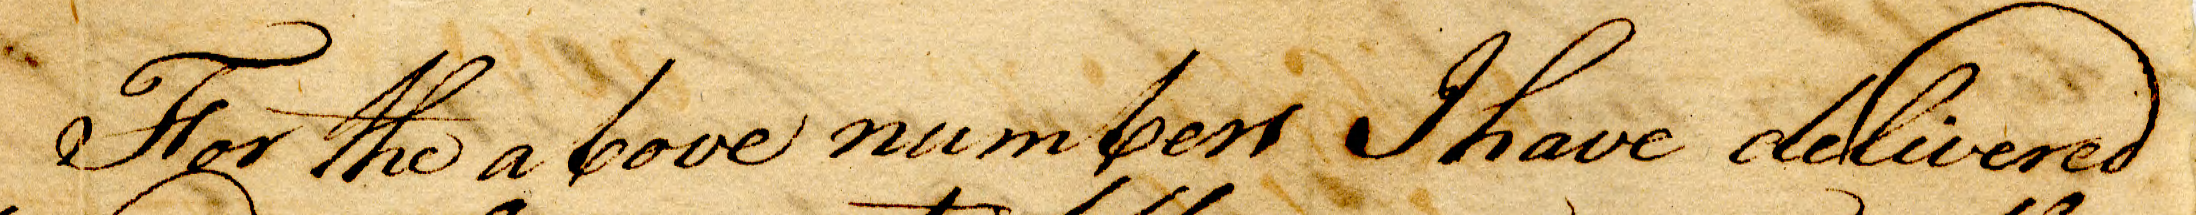a 1 tcemumtars Iive de
